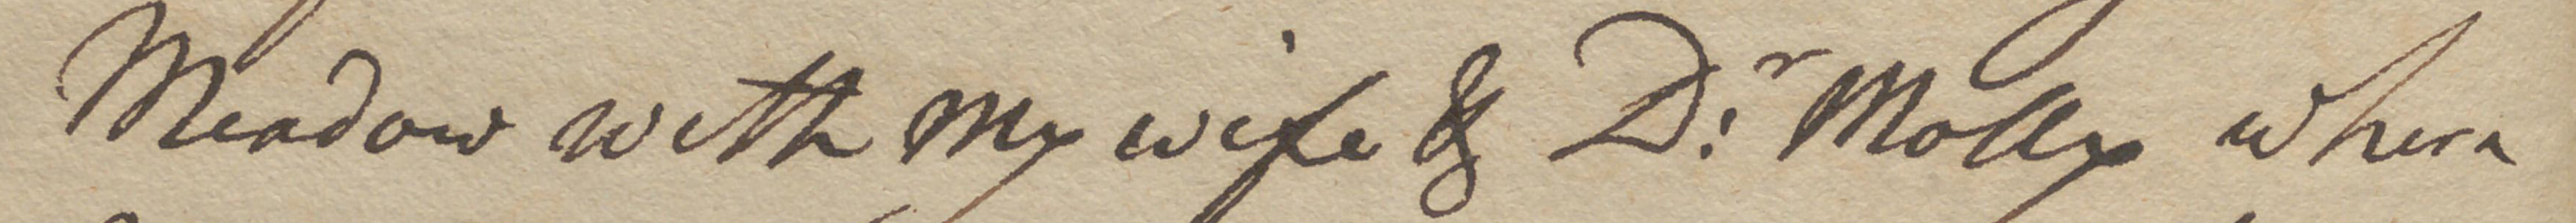Meadow with my wife & D^r: Molly where
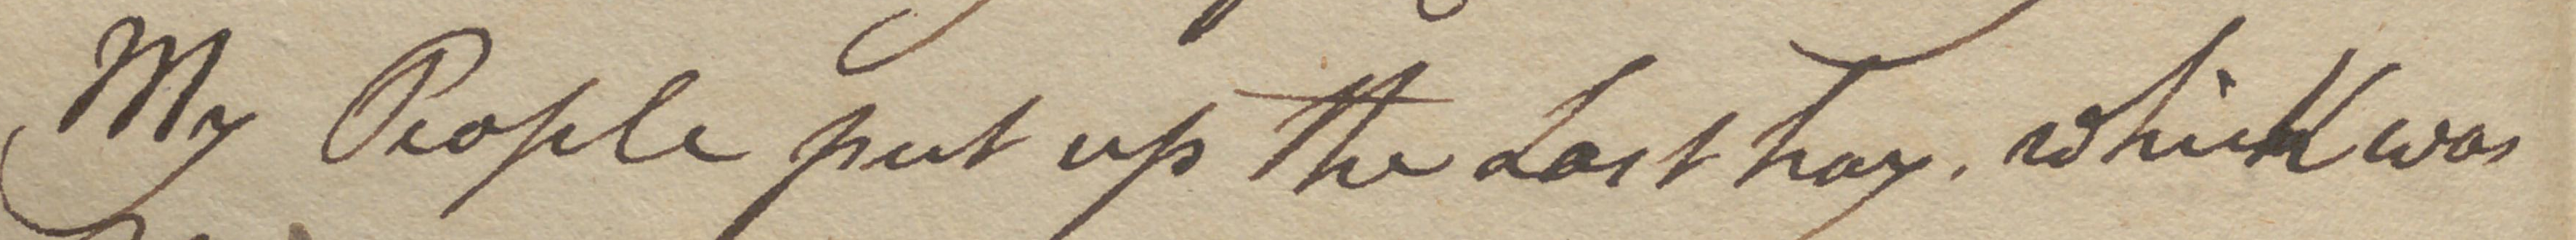My People put up the Last hay. which was
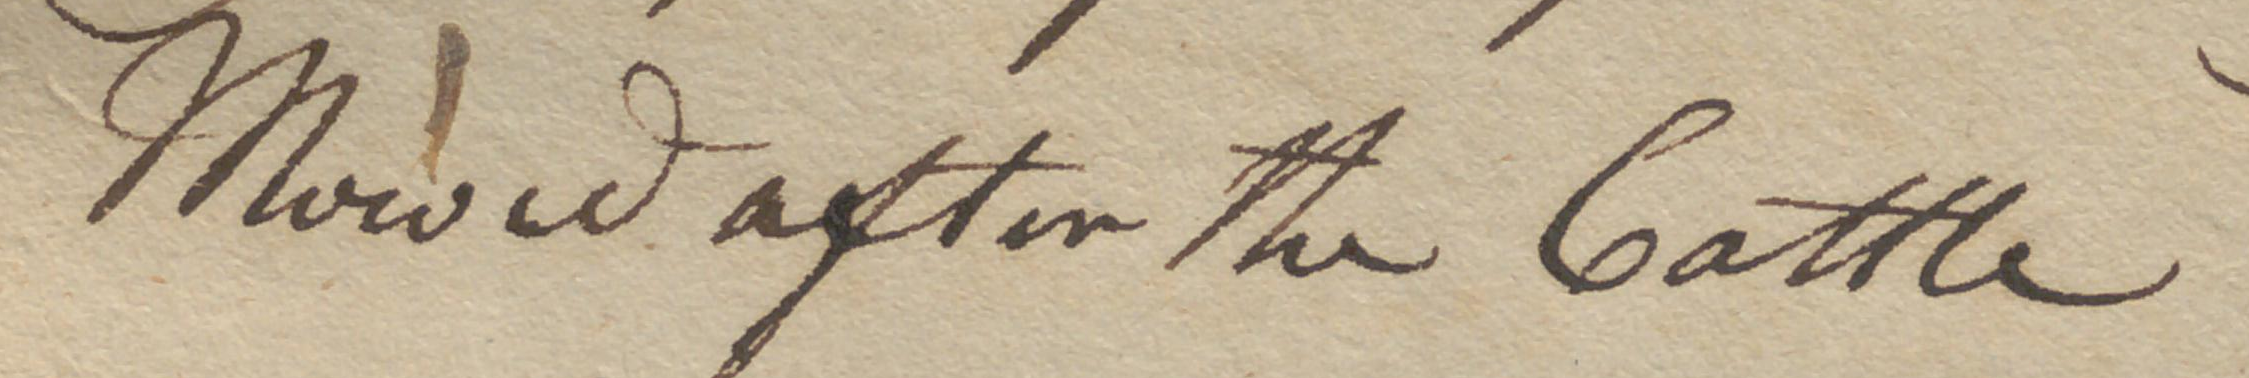Mowed after the Cattle
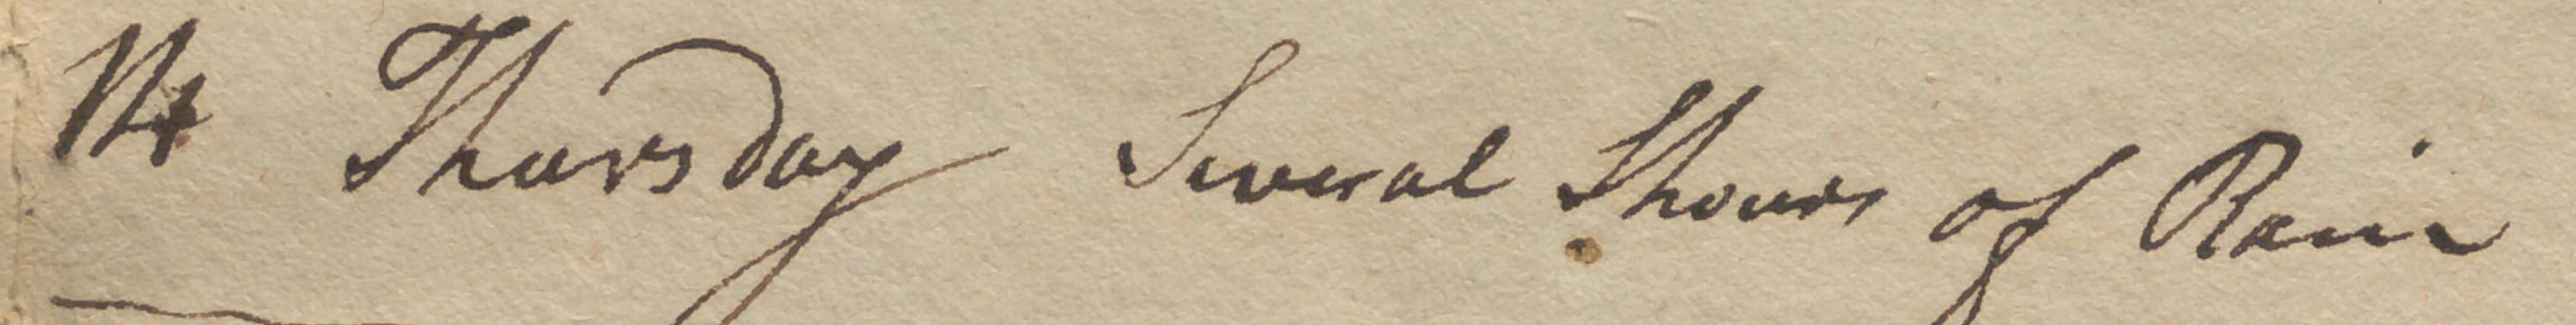14 Thursday Several Shours of Rain
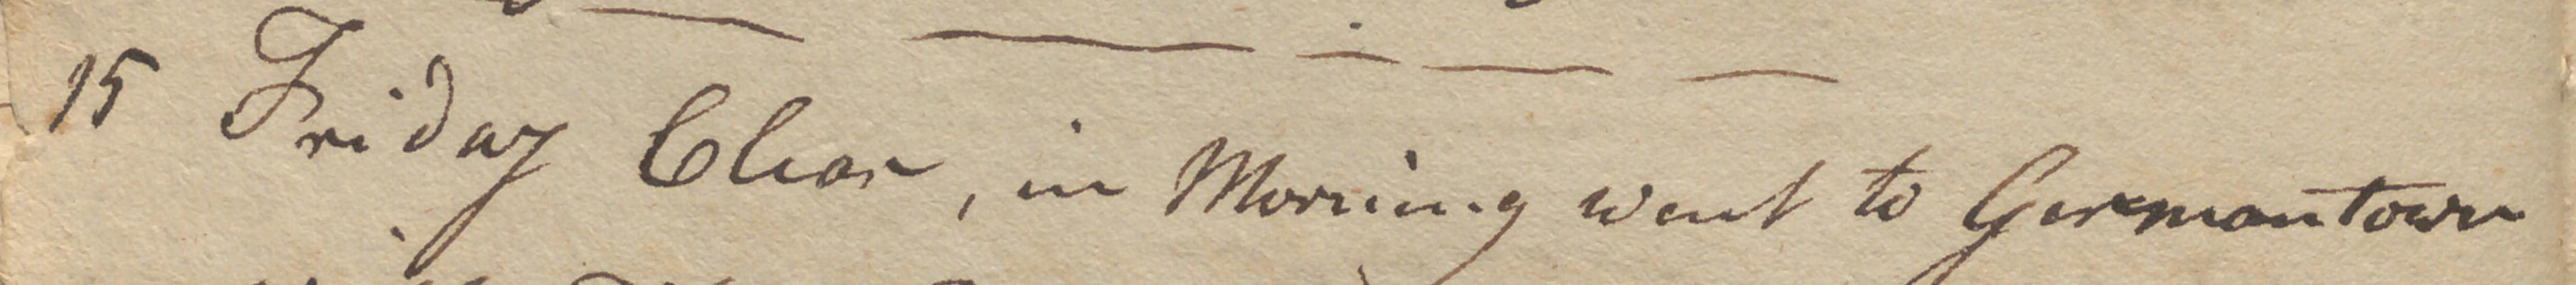15 Friday Clear, in Morning went to Germantown
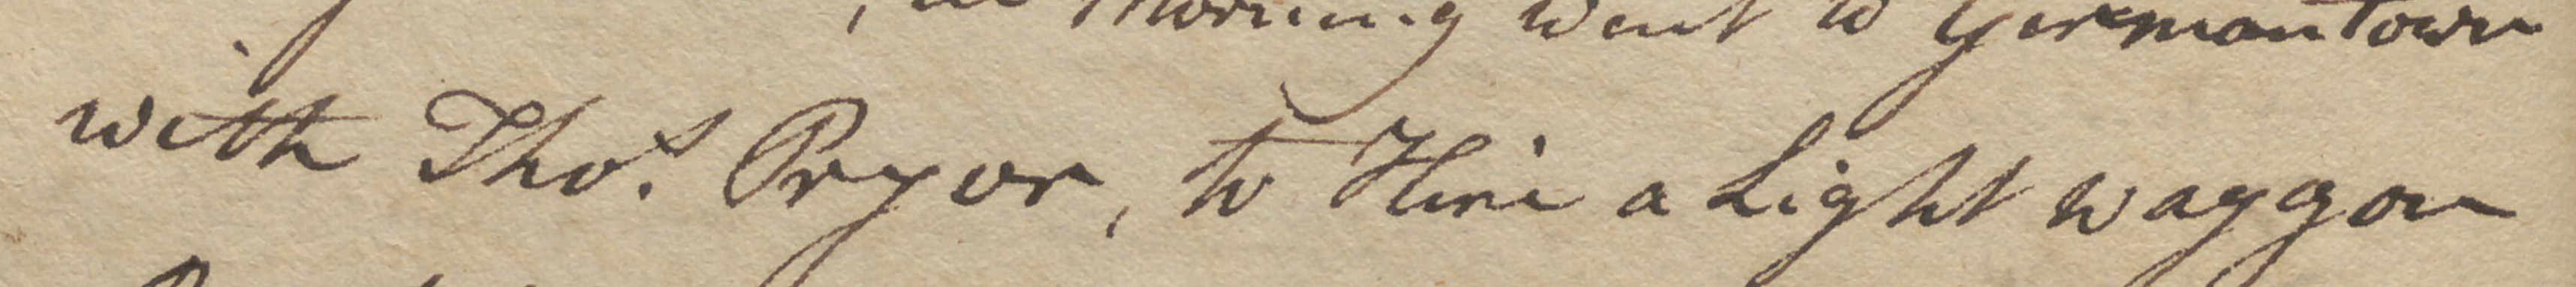with Tho^s. Pryor to Hire a Light waggon
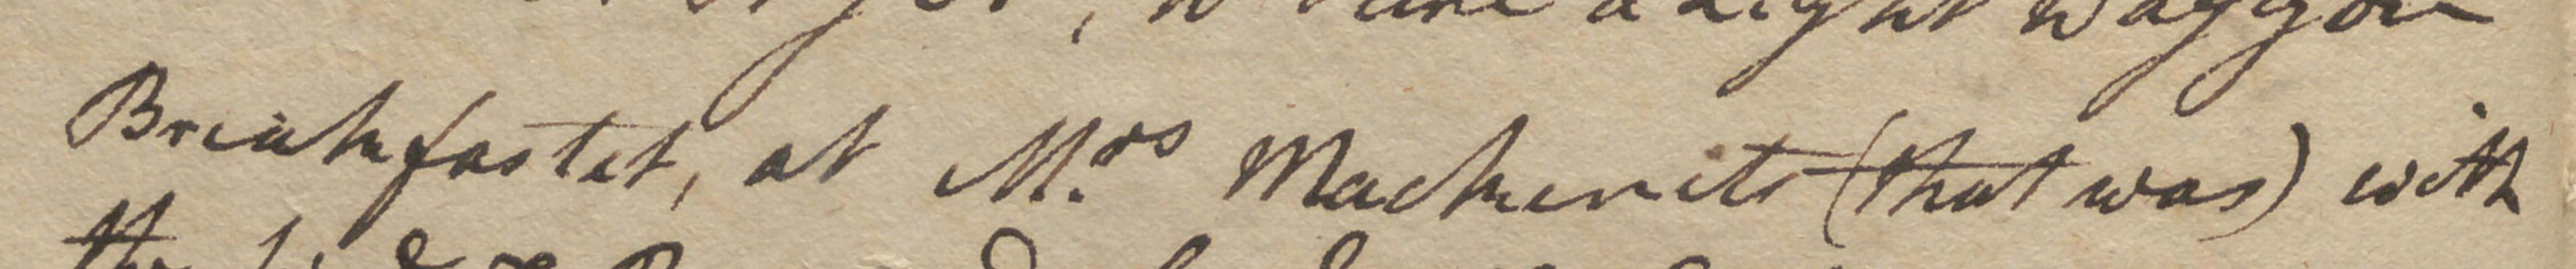Breahfastet at M^rs. Mahkenits (that was) with
